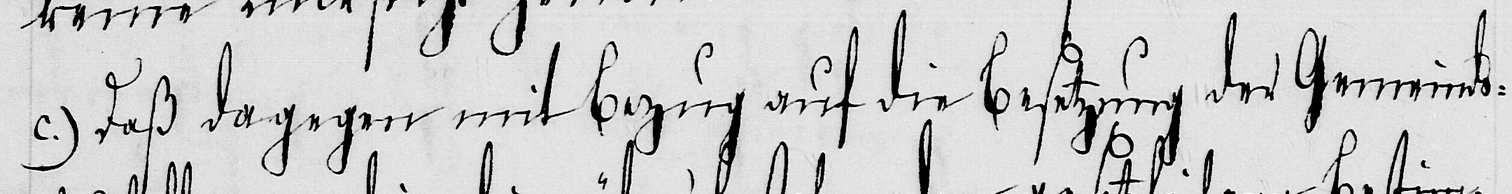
c.) Daß dagegen mit Bezug auf die Besetzung der Gemeind¬
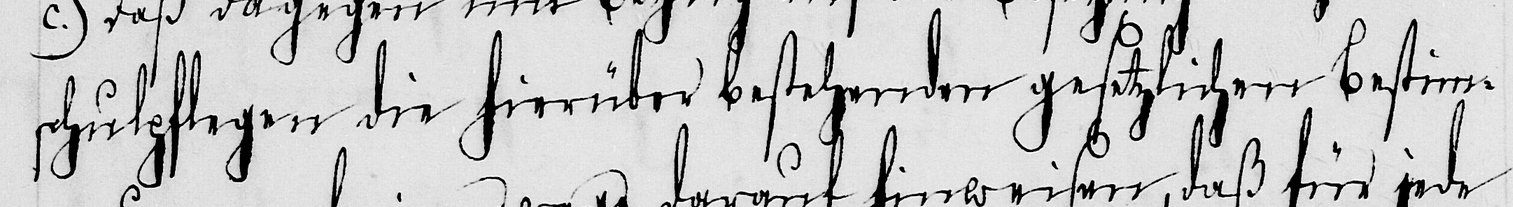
schulpflegen die hierüber bestehenden gesetzlichen Bestim¬
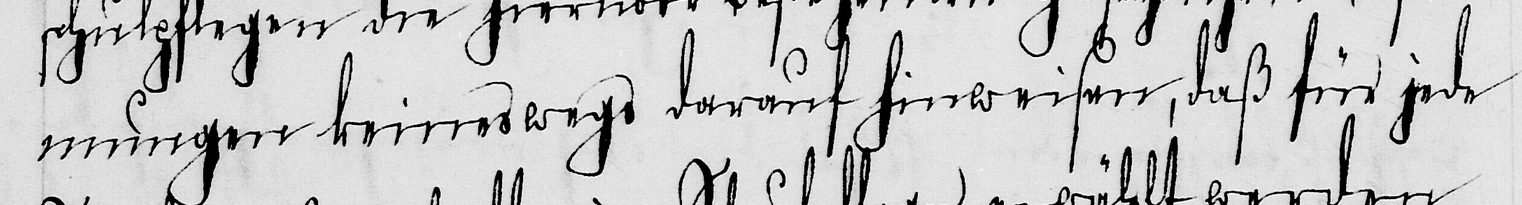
mungen keineswegs darauf hinweisen, daß für jede
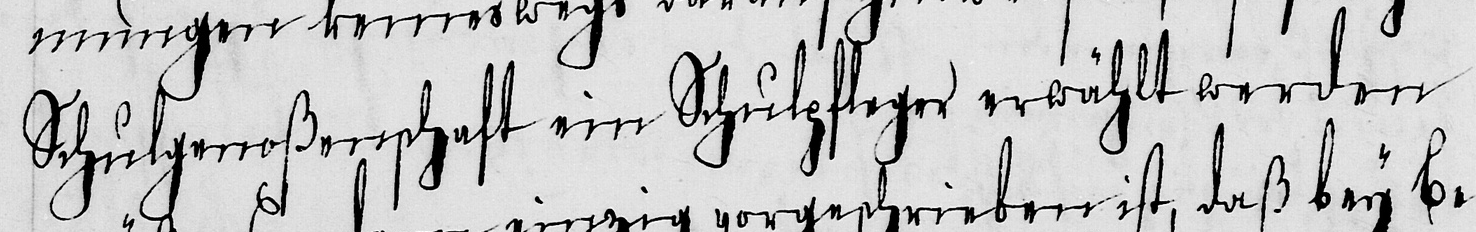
Schulgenoßenschaft ein Schulpfleger erwählt werden
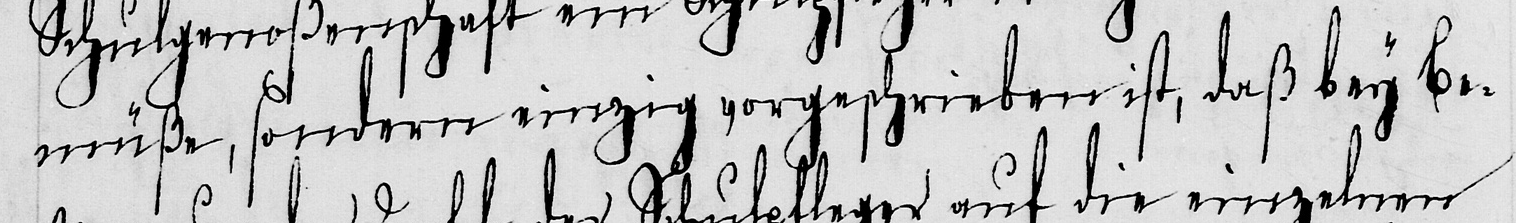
müße, sondern einzig vorgeschrieben ist, daß bey Bes¬
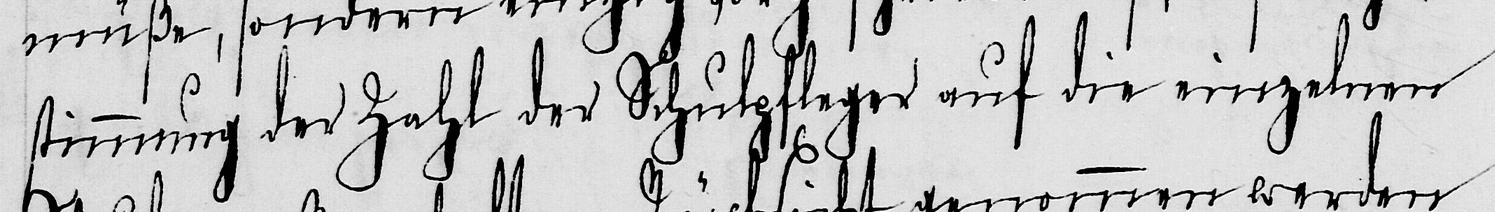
timmung der Zahl der Schulpfleger auf die einzelnen
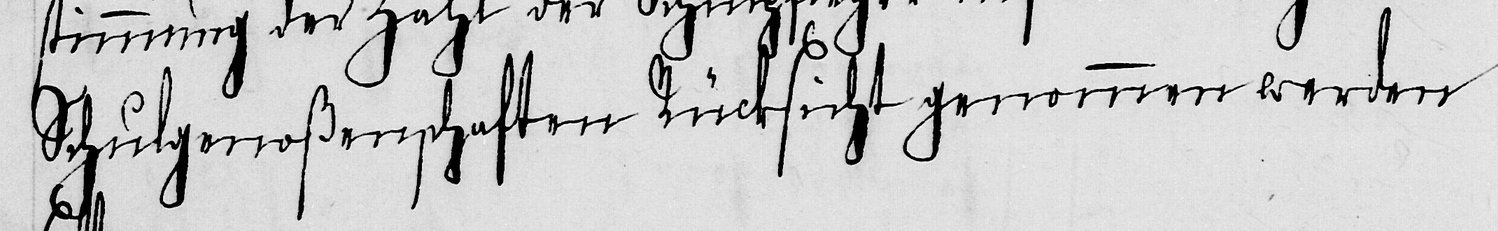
Schulgenoßenschaften Rücksicht genommen werden
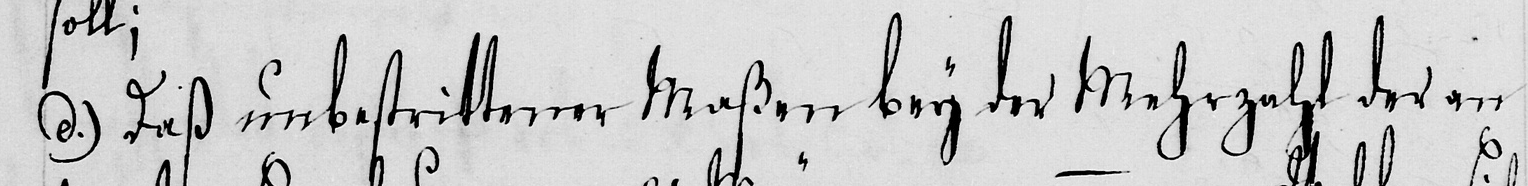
d.) Daß unbestrittener Maßen bey der Mehrzahl der an
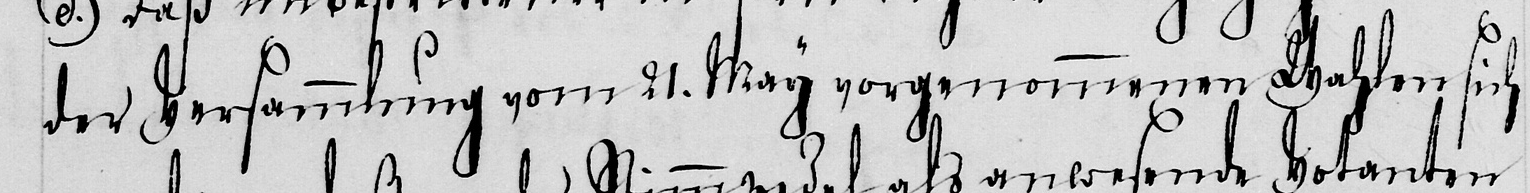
der Versammlung vom 21. May vorgenommenen Wahlen sich
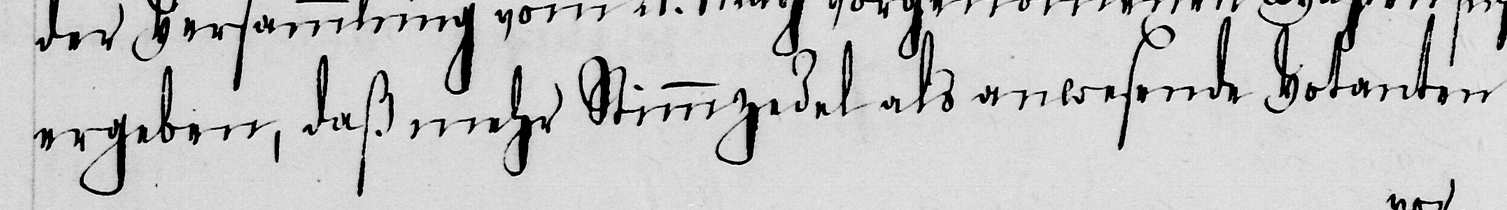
ergeben, daß mehr Stimmzedel als anwesende Votanten
